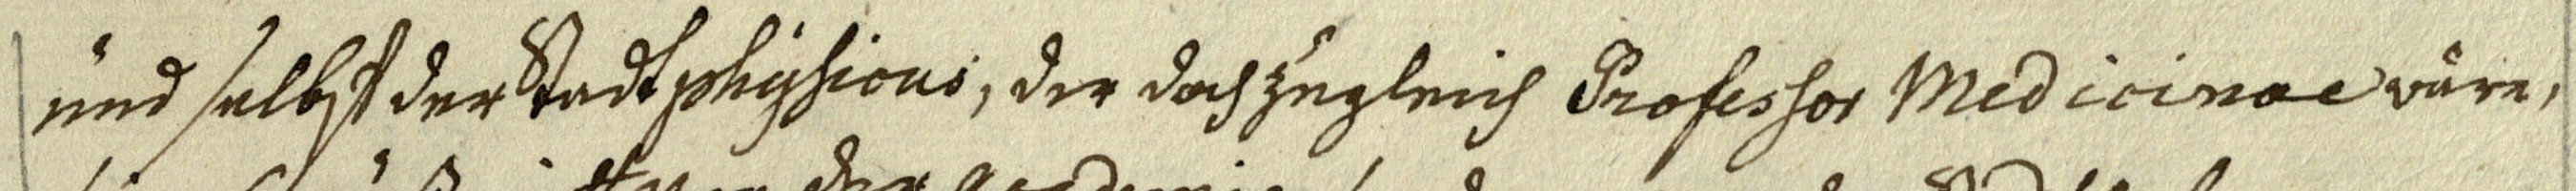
und selbst der Stadtphÿsicus, der doch zugleich Professor Medicinae wäre,
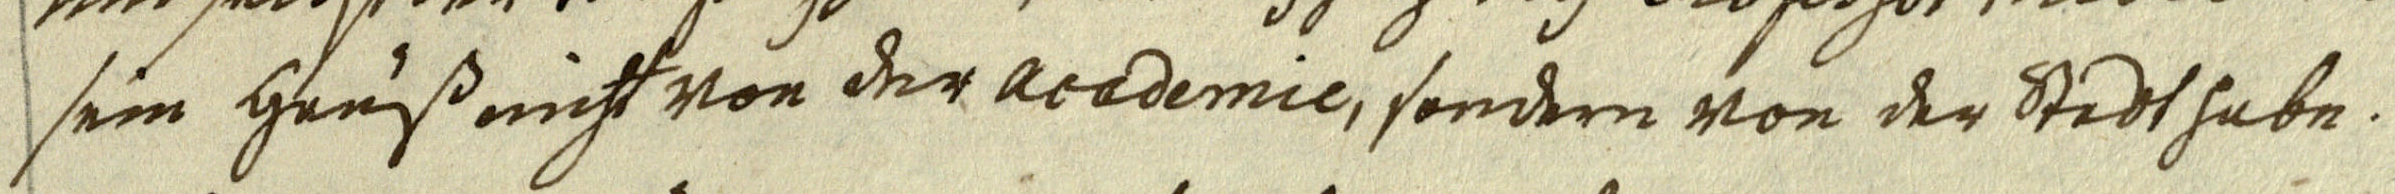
sein Haus nicht von der Academie, sondern von der Stadt habe.
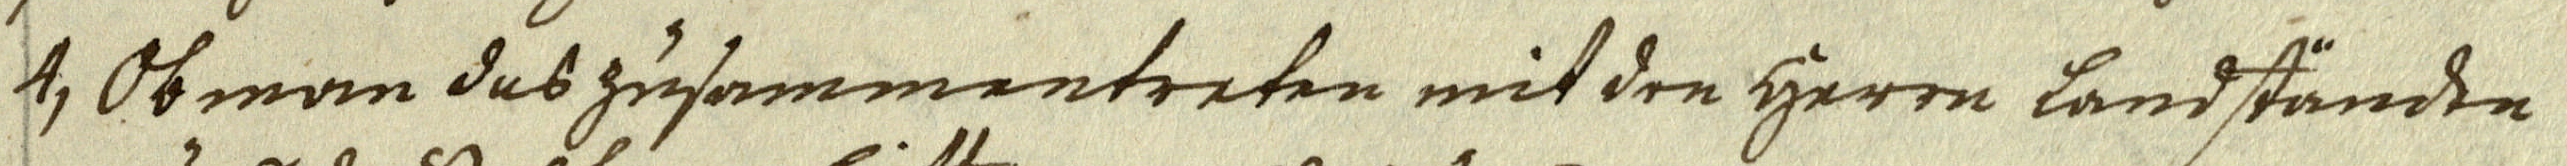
4, Ob man das Zusammentreten mit den Herrn Landständen
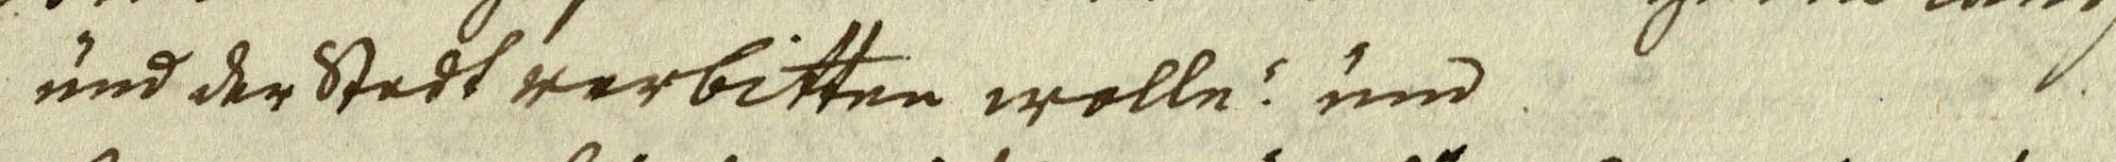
und der Stadt verbitten wolle, um
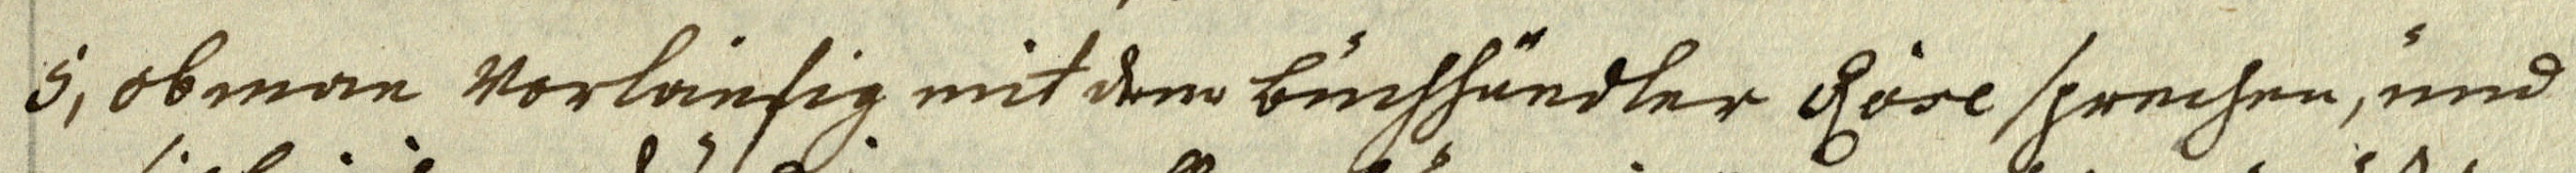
5, ob man vorläufig mit dem Buchhändler Röse sprechen, und
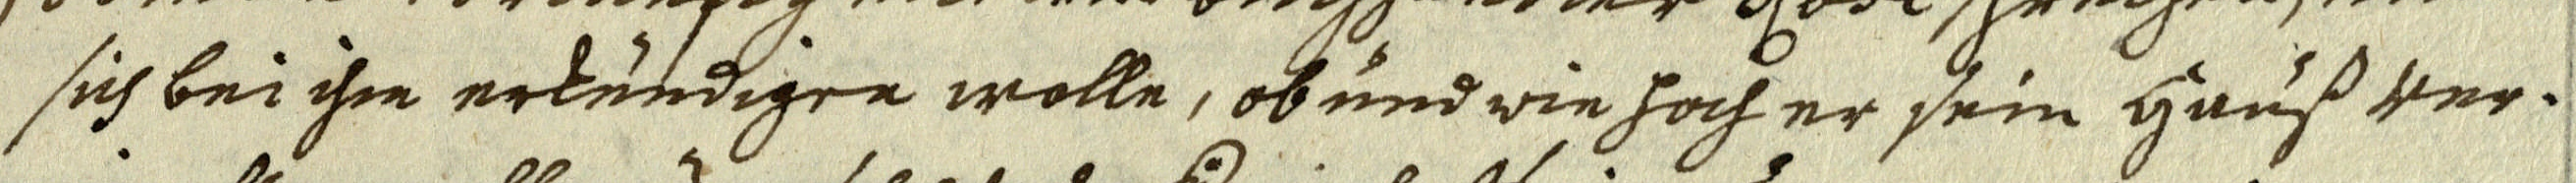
sich bei ihm erkundigen wolle, ob und wie hoch er sein Haus ver¬
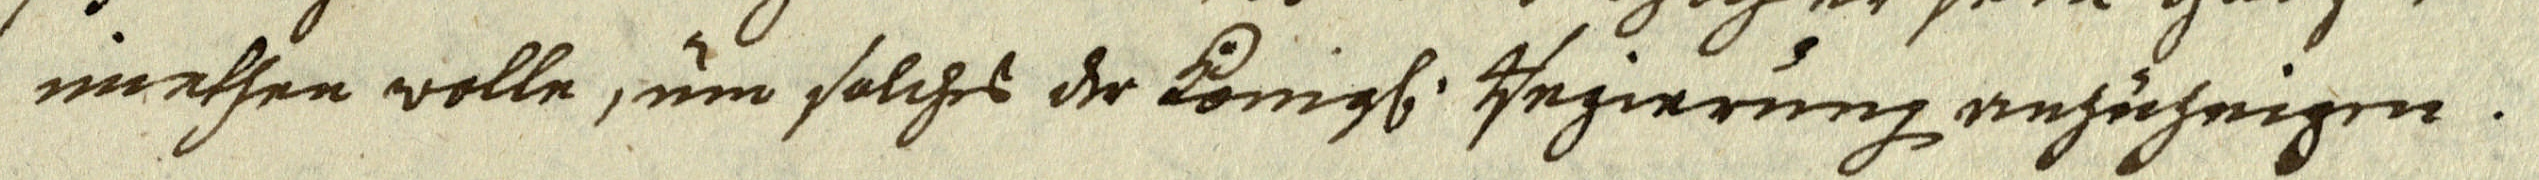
miethen wolle, um solches der Königl. Regierung anzuzeigen.
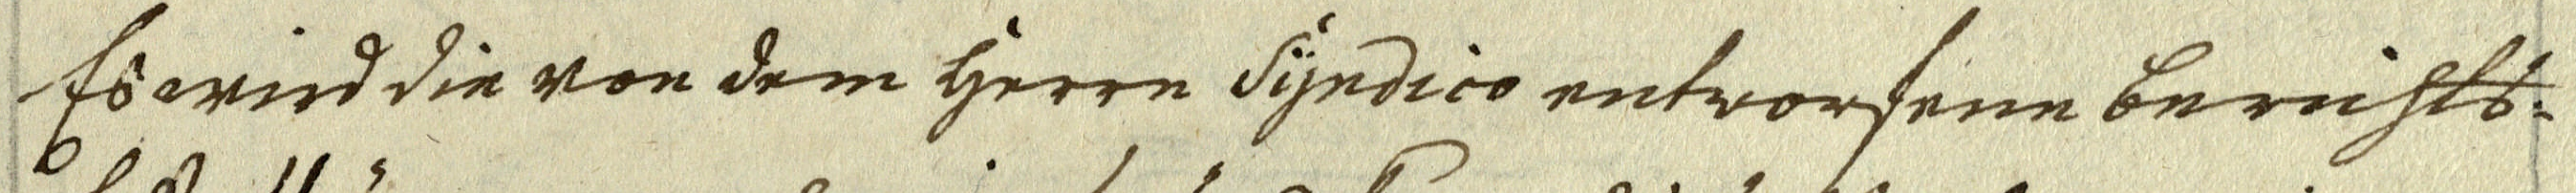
Es wird die von dem Herrn Sÿndico entworfene Berichts¬
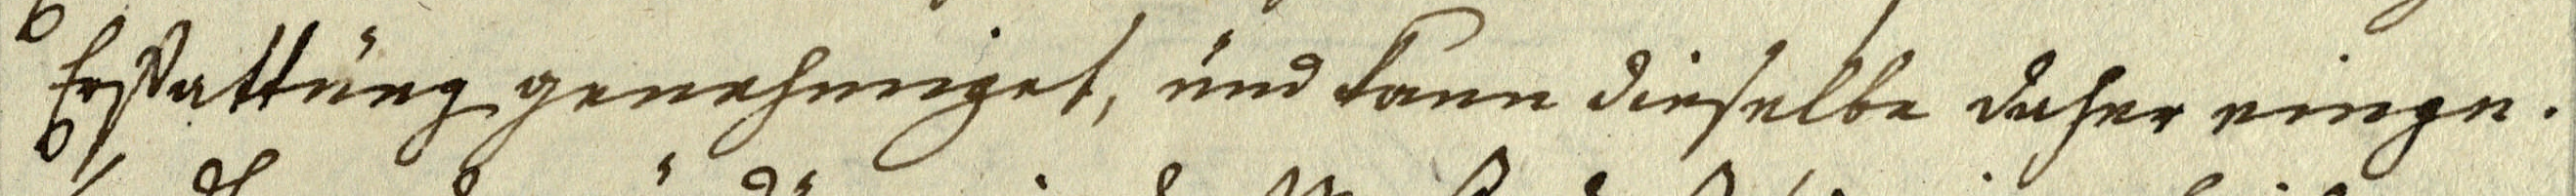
Erstattung genehmiget, und kann dieselbe daher einge¬
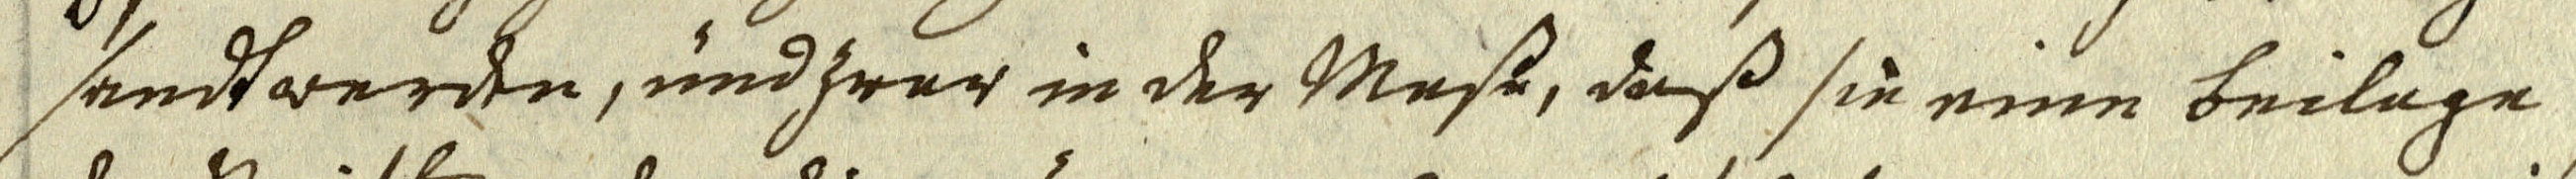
sandt werden, und zwar in der Maße, daß sie eine Beilage
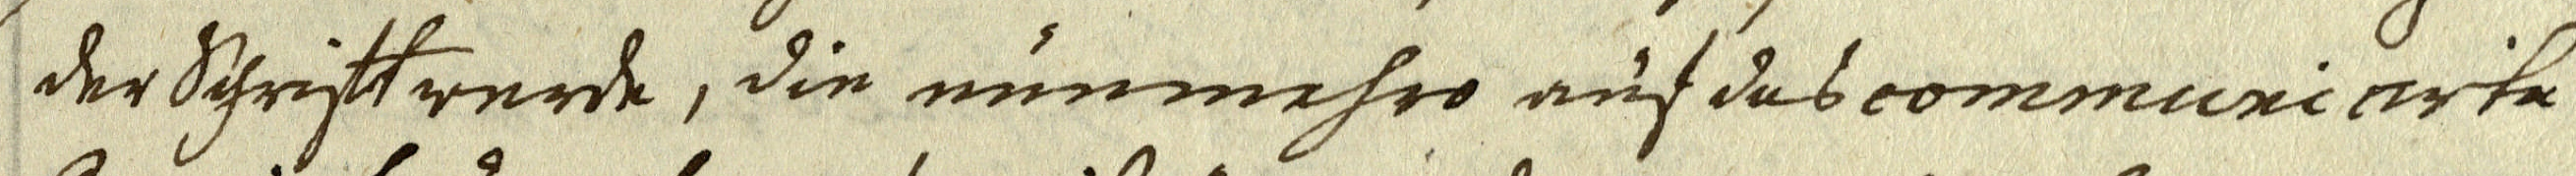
der Schrift werde, die nunmehro auf das communicirte
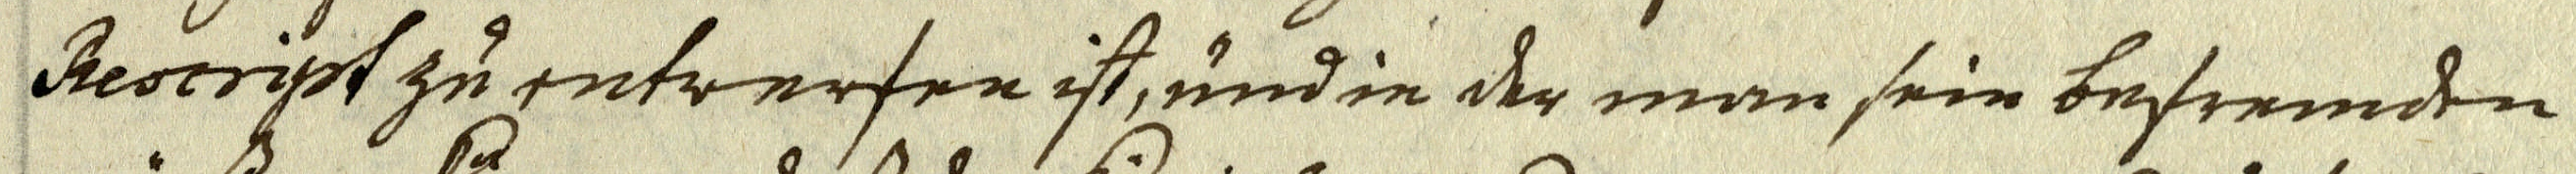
Rescript zu entwerfen ist, und in der man sein Befremden
